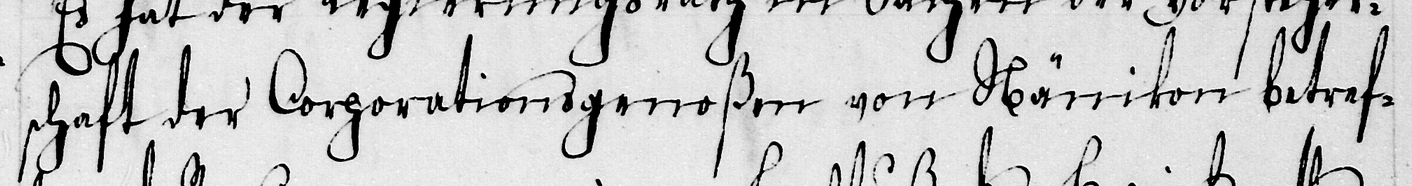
schaft der Corporationsgenoßen von Nänikon betref¬
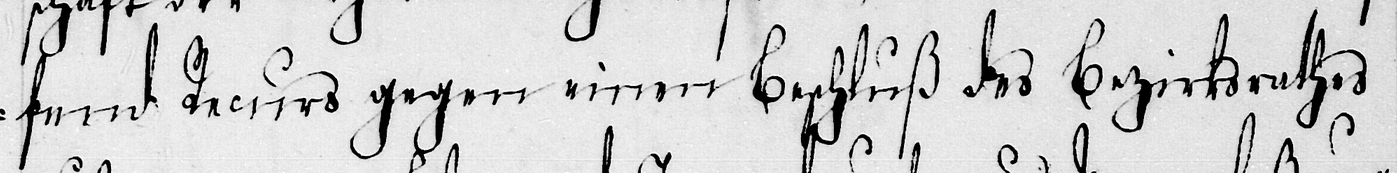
fend Recurs gegen einen Beschluß des Bezirksrathes
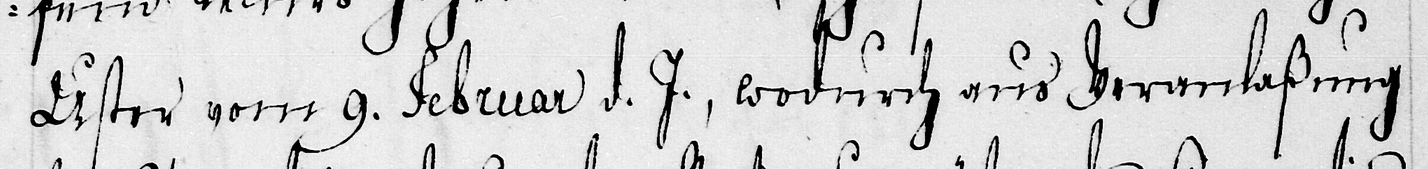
Uster vom 9. Februar l. J., wodurch aus Veranlaßung
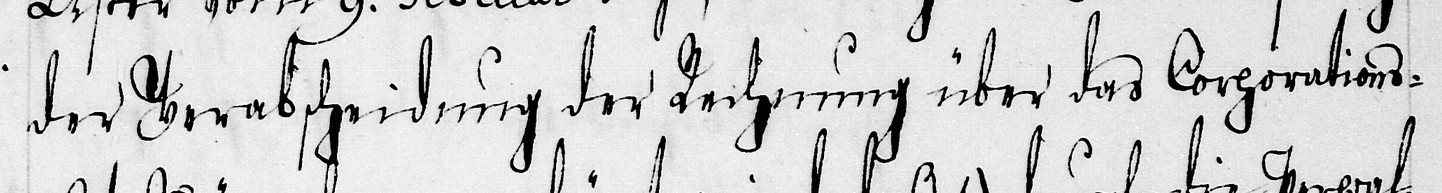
der Verabscheidung der Rechnung über das Corporations¬
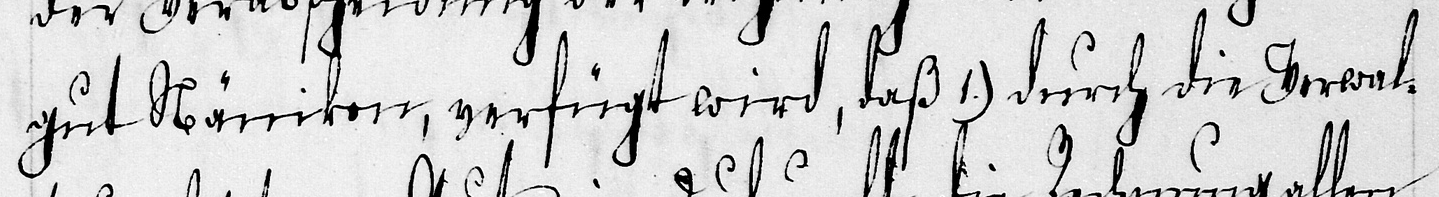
gut Nänikon, verfügt wird, daß 1.) durch die Verwal¬
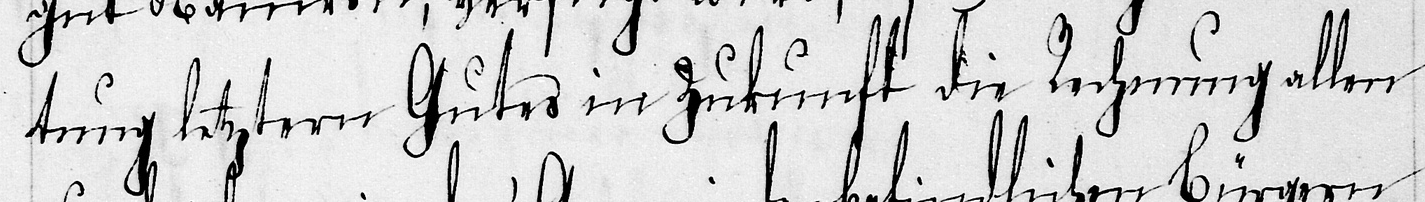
tung letztern Gutes in Zukunft die Rechnung allen
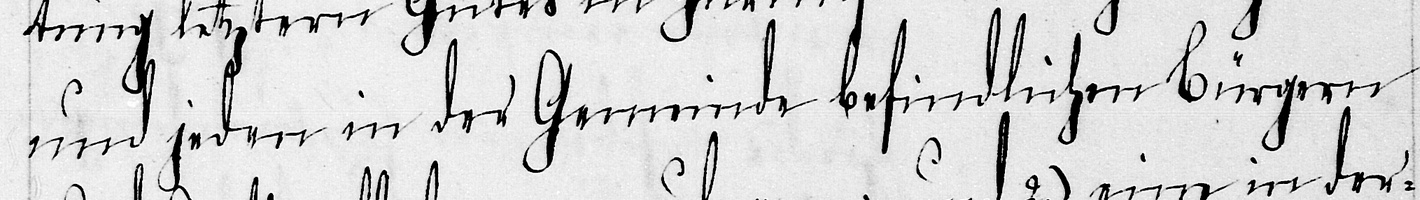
und jeden in der Gemeinde befindlichen Bürgern
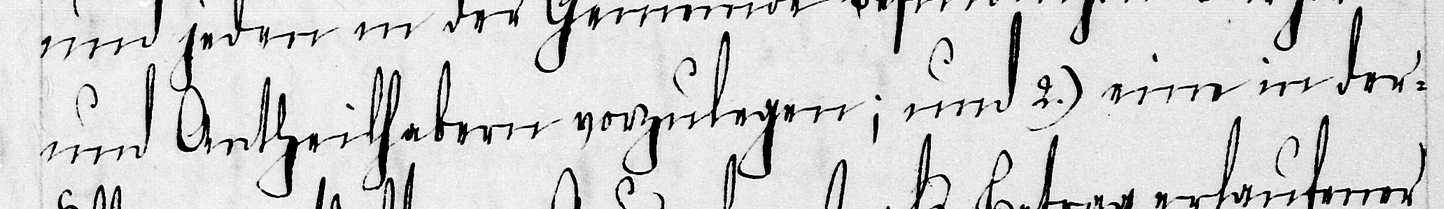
und Antheilhabern vorzulegen, und 2.) eine in der¬
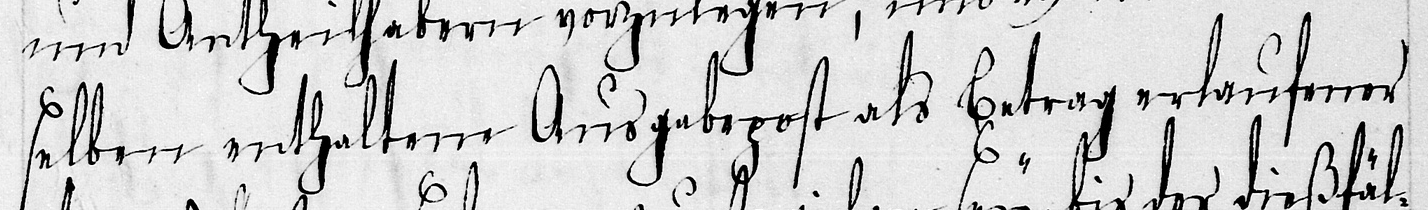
selben enthaltene Ausgabepost als Betrag erlaufener
